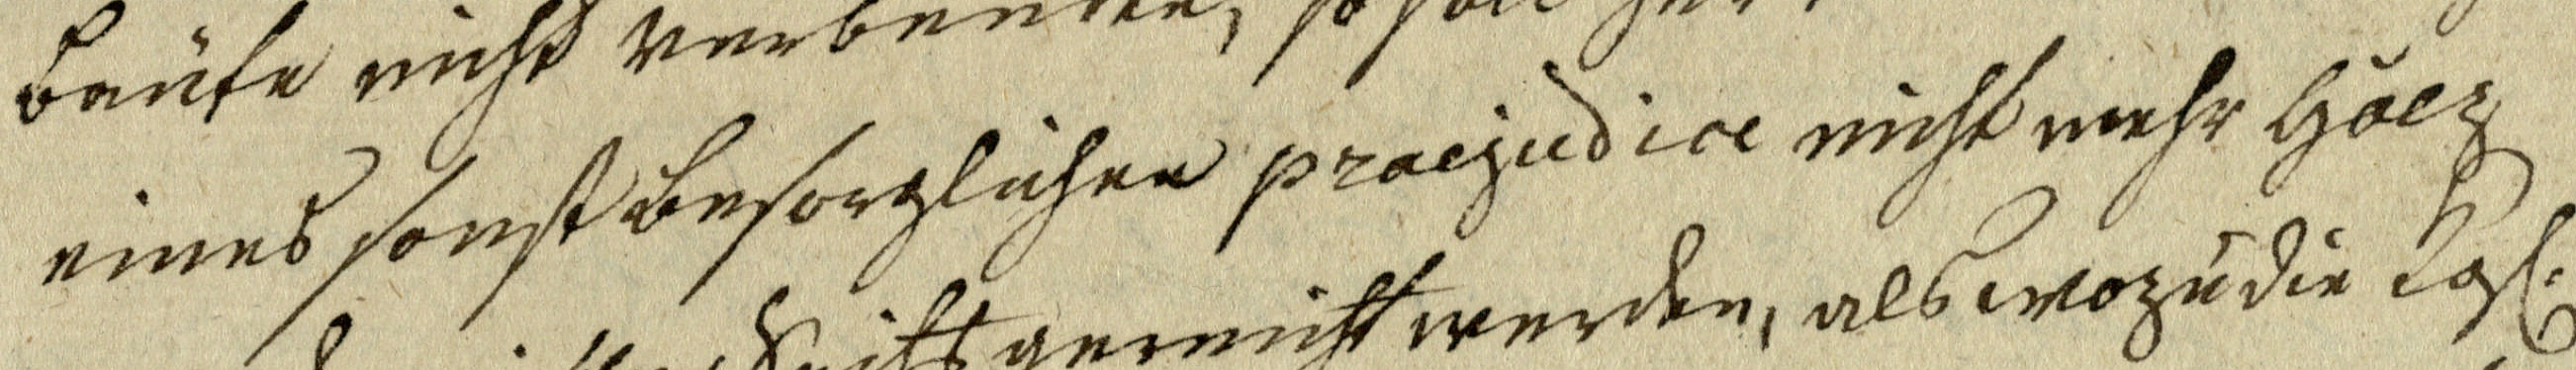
eines sonst besorglichen praejudice nicht mehr Holz
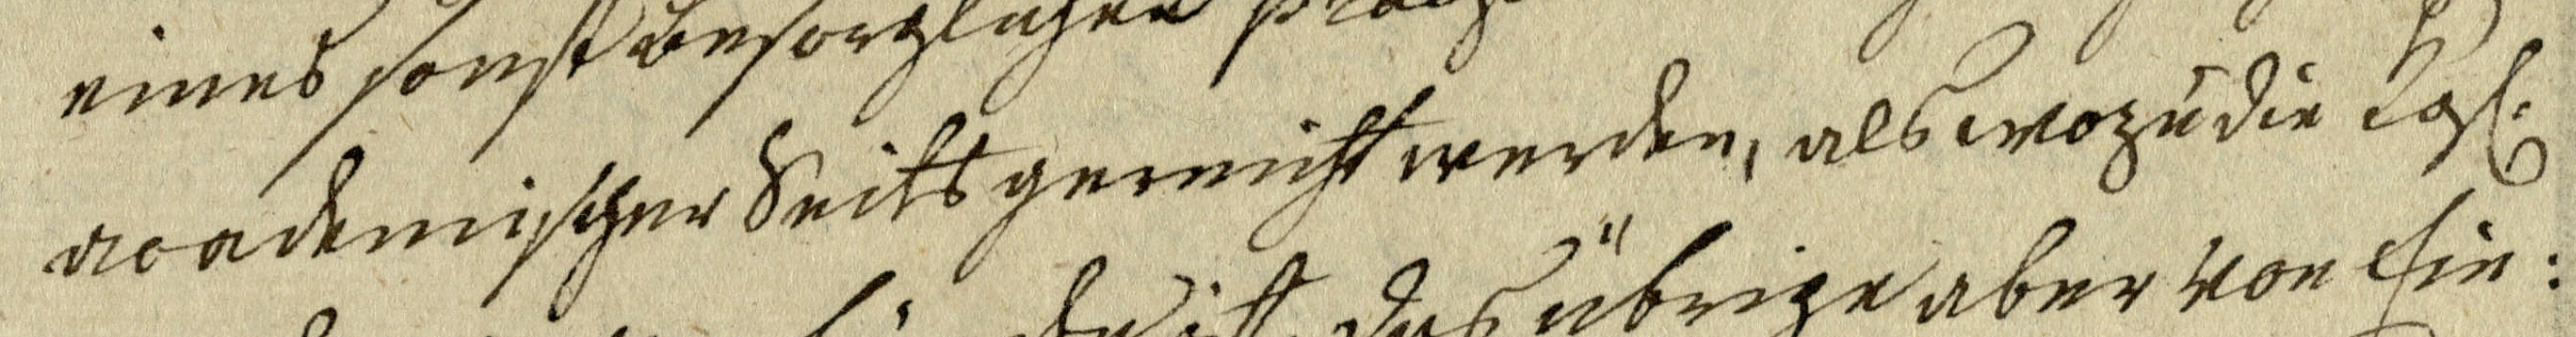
academischer Seits gereicht werden, als wozu die Kgl.
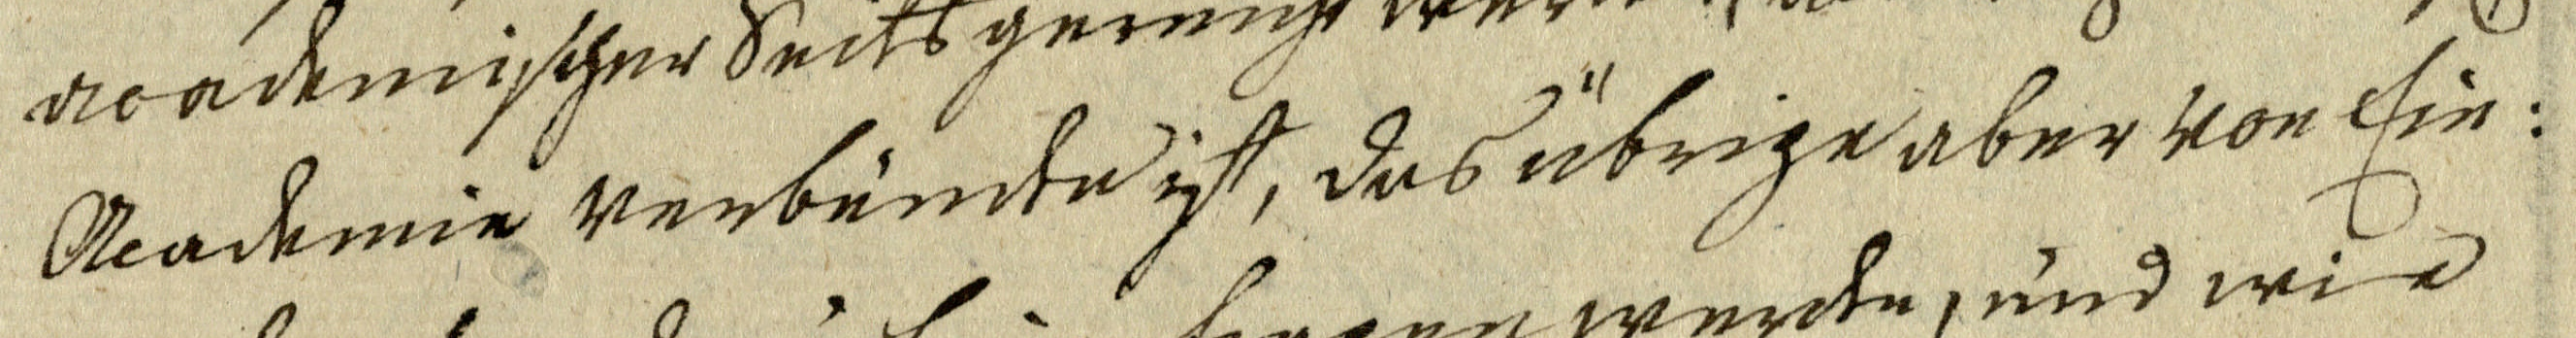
Academie verbunden ist, das übrige aber von Ein¬
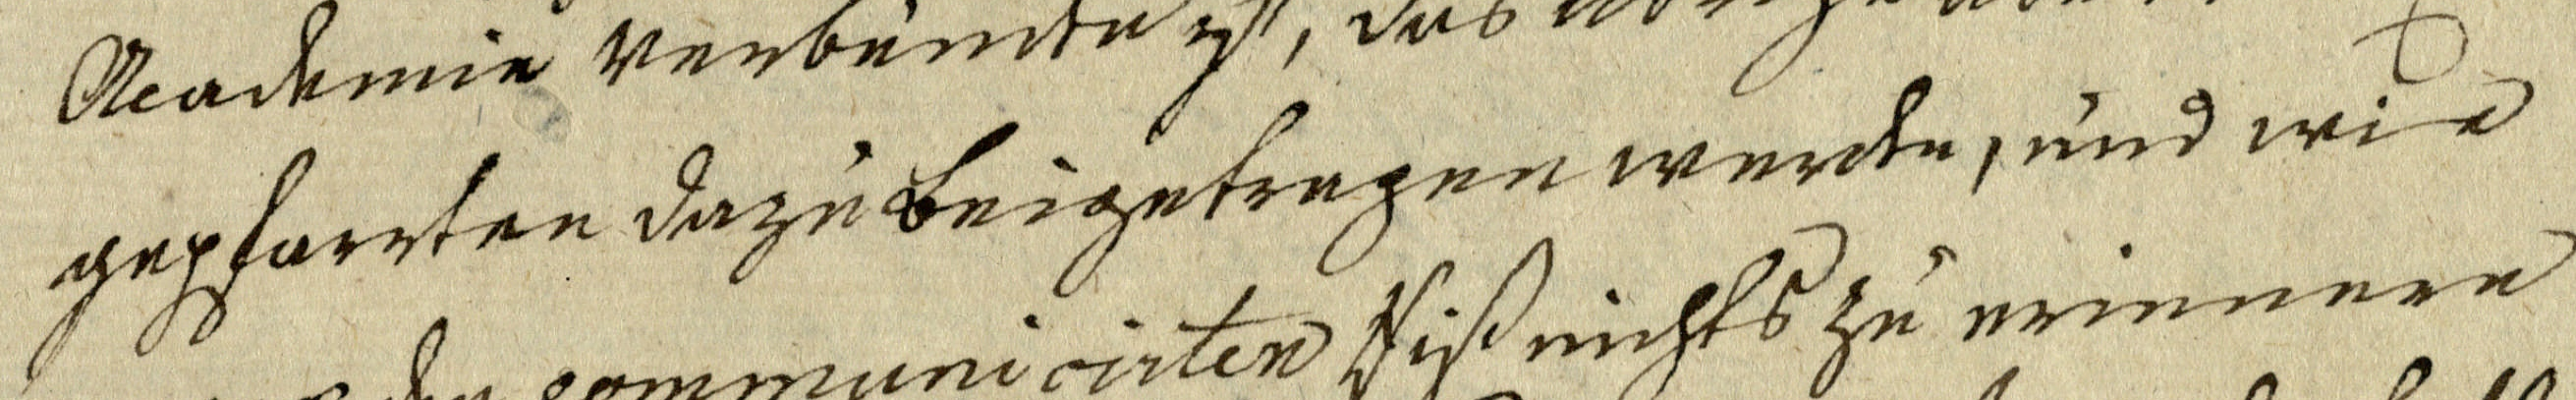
gepfarrten dazu Beigetragen werden, und wie
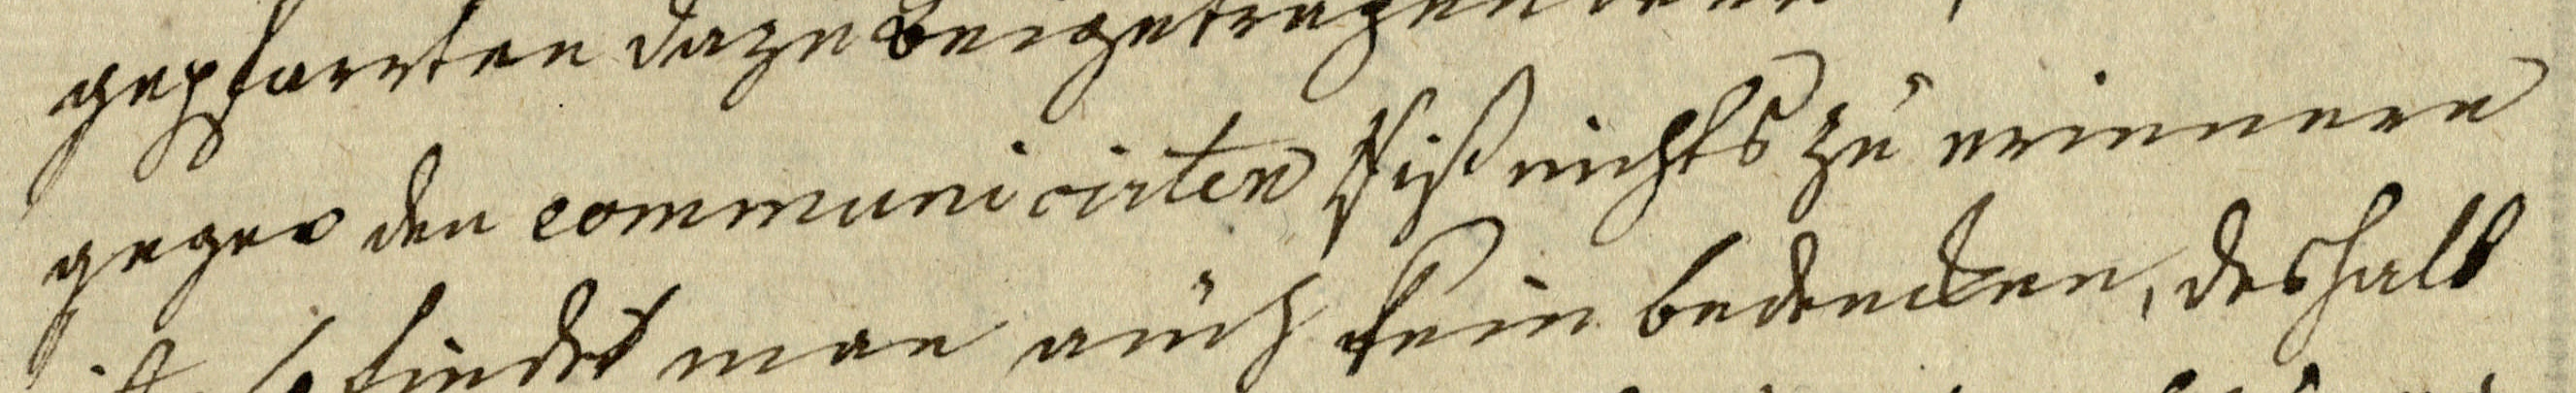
gegen den communicirten Riß nichts zu erinnern
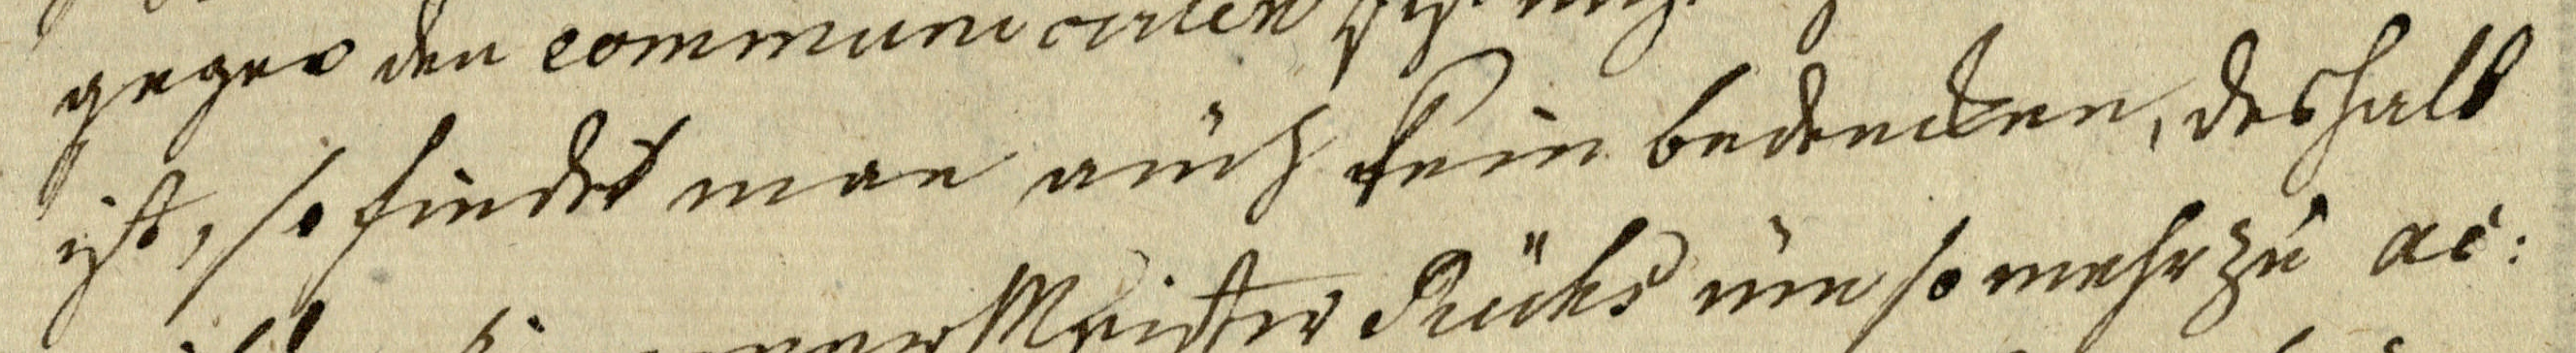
ist, so findet man auch kein Bedencken, deshalb
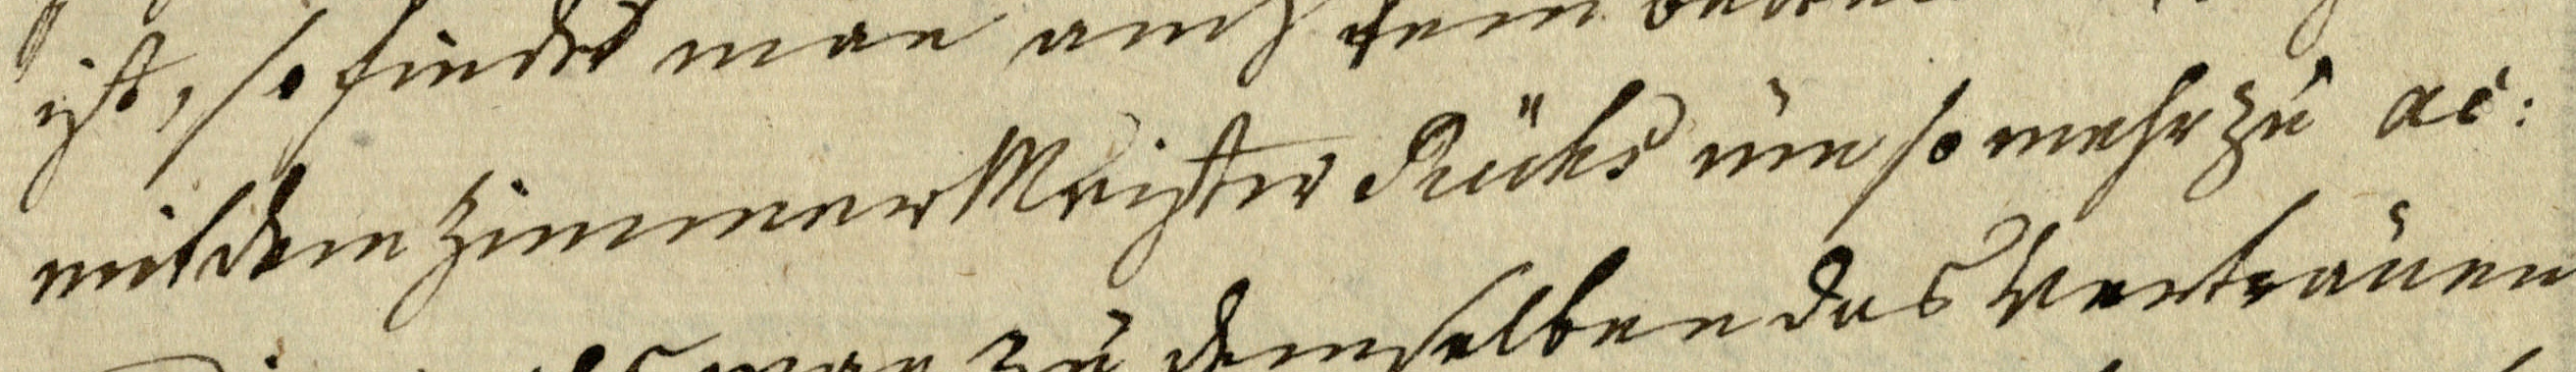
mit dem ZimmerMeister Rühs um so mehr zu ac¬
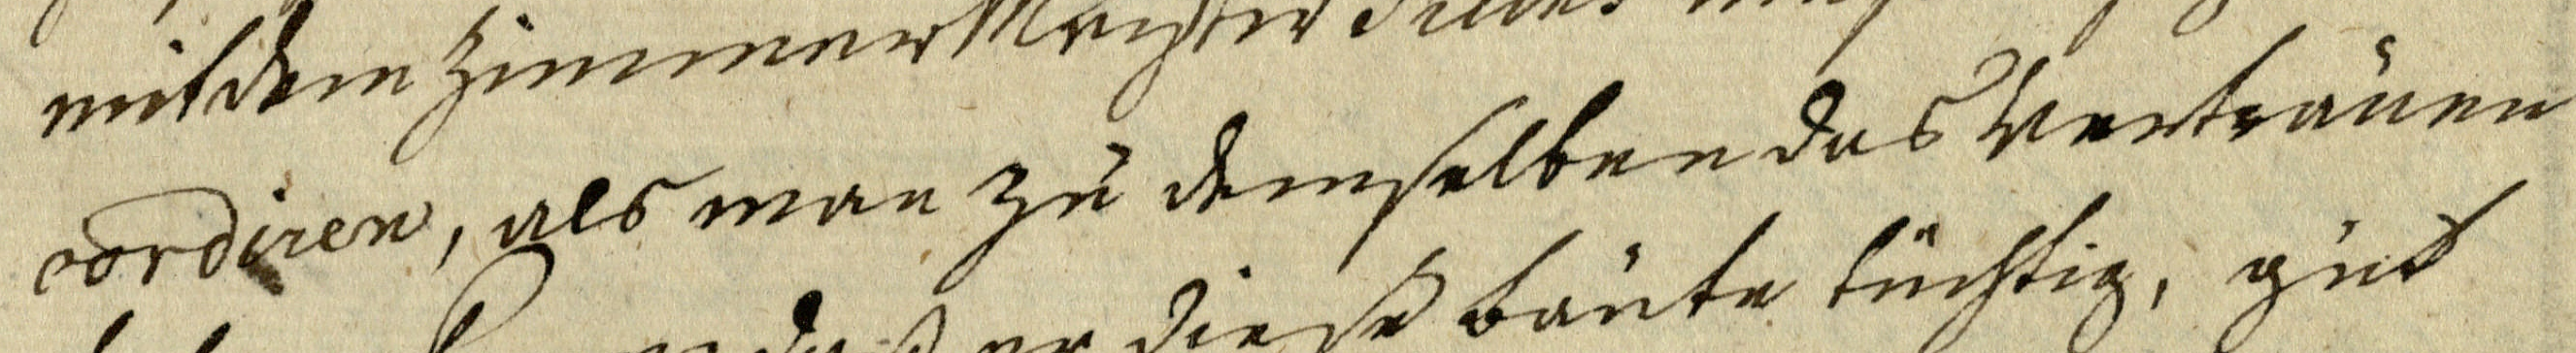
cordiren, als man zu demselben das Vertrauen
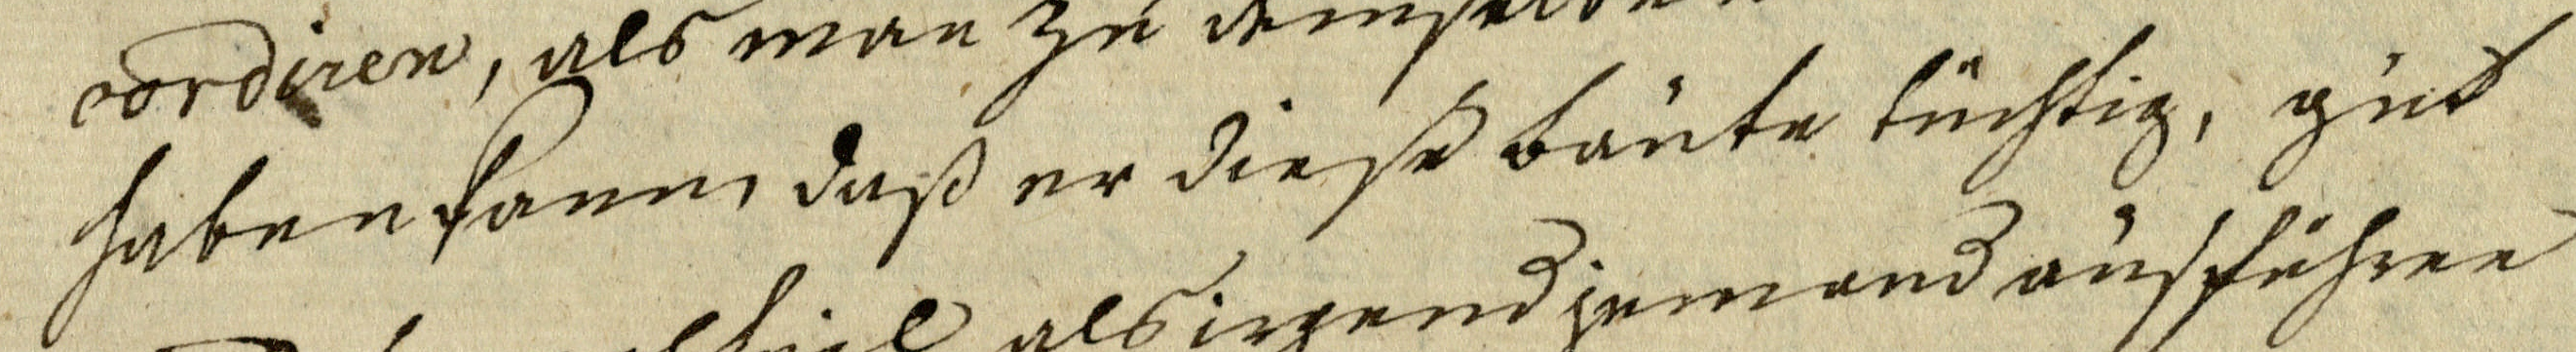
haben kann, daß er diese Baute tüchtig, gut
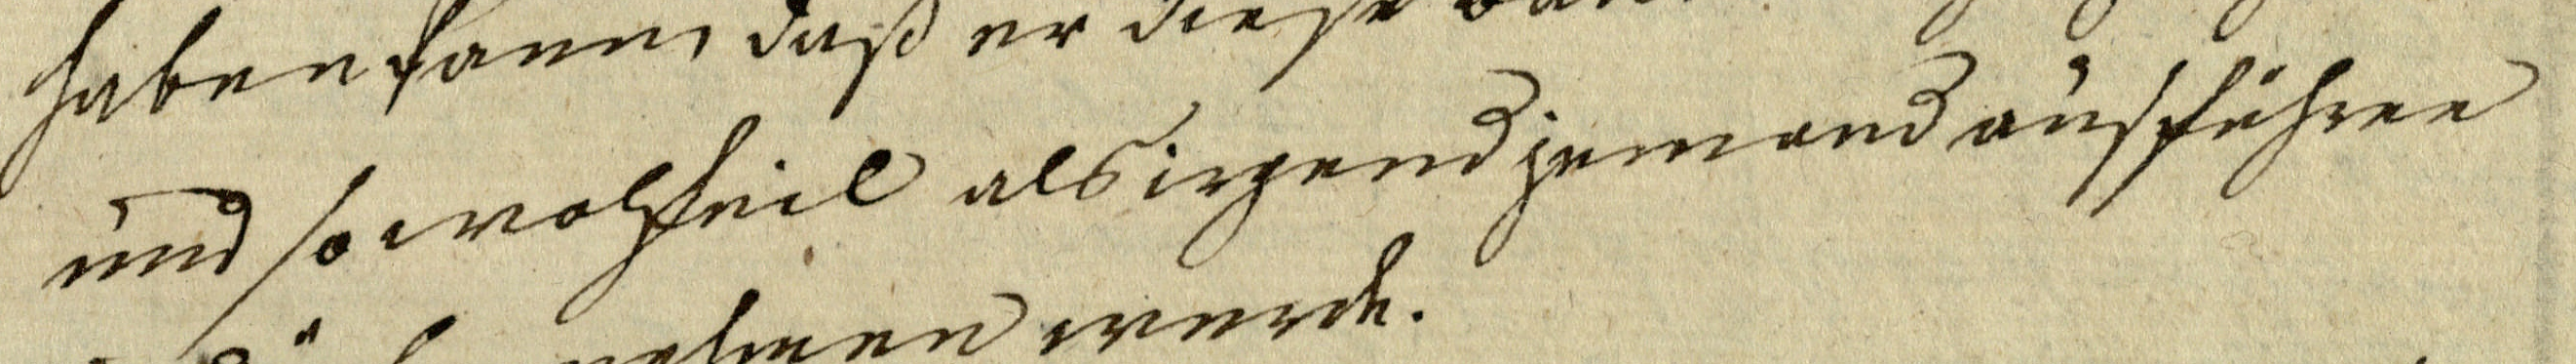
und so wolfeil als irgend jemand ausführen
